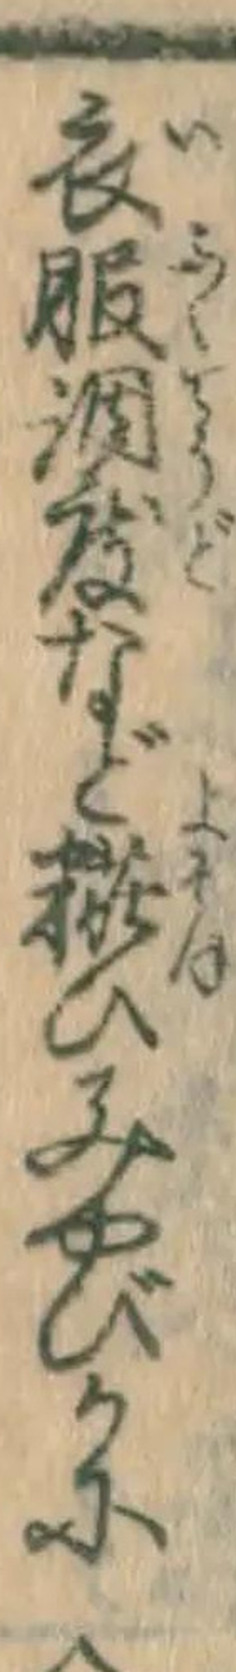衣服調度など粧ひみやびかに
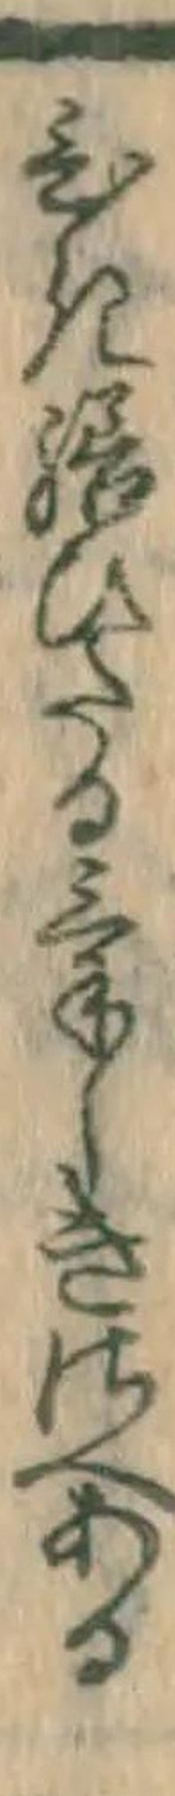ひき繕ひたる気しきさへある
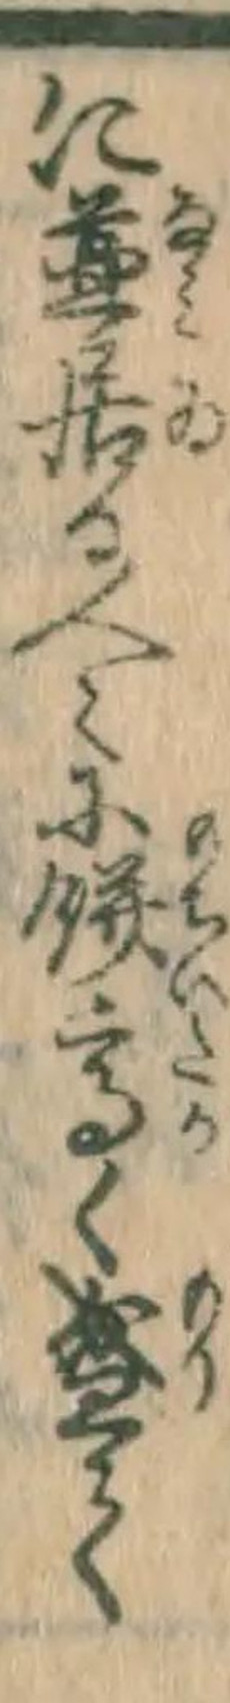に並居る人々に餅高く盛て
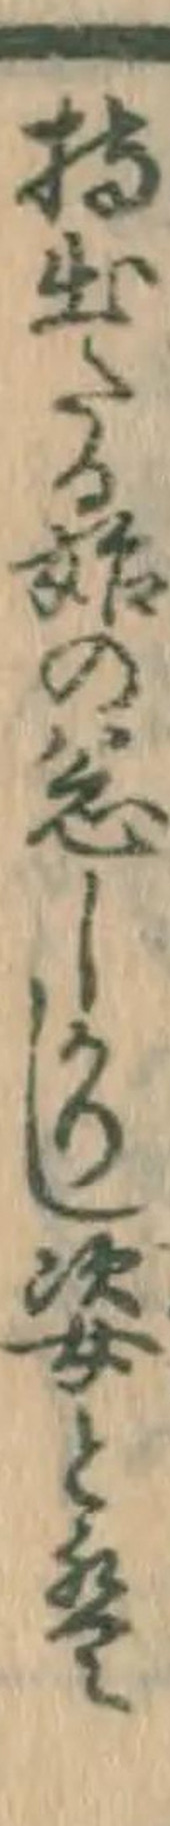持出たる始の忩しかりし姿とは
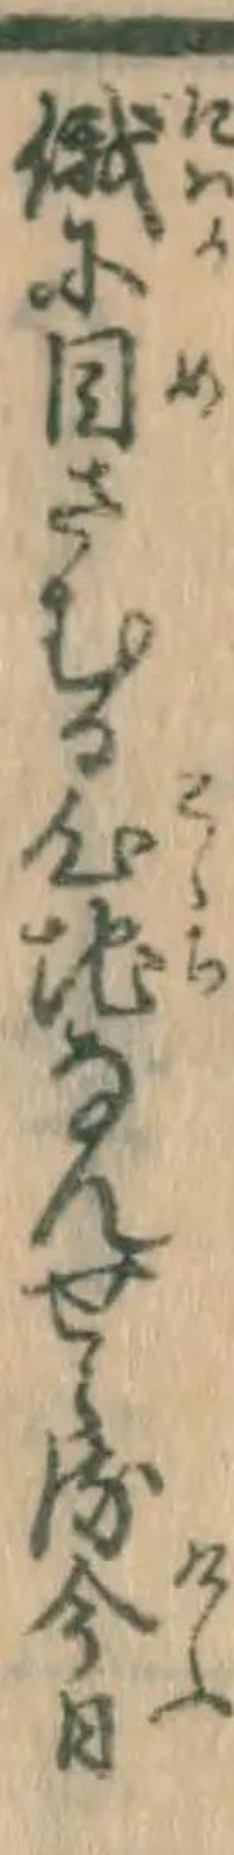俄に目さむる心地なんせらる今日
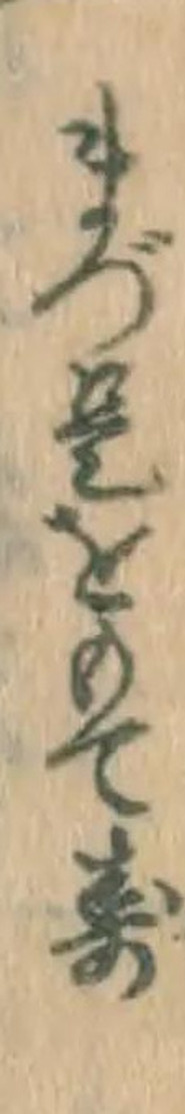まづ是をもて寿
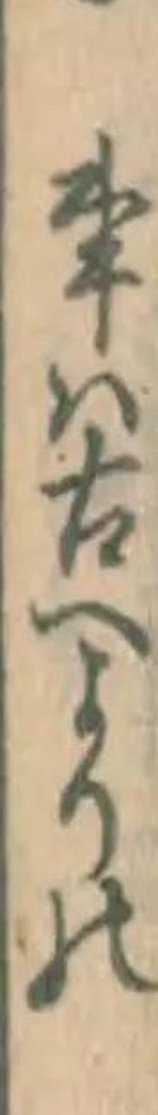事は古へよりの
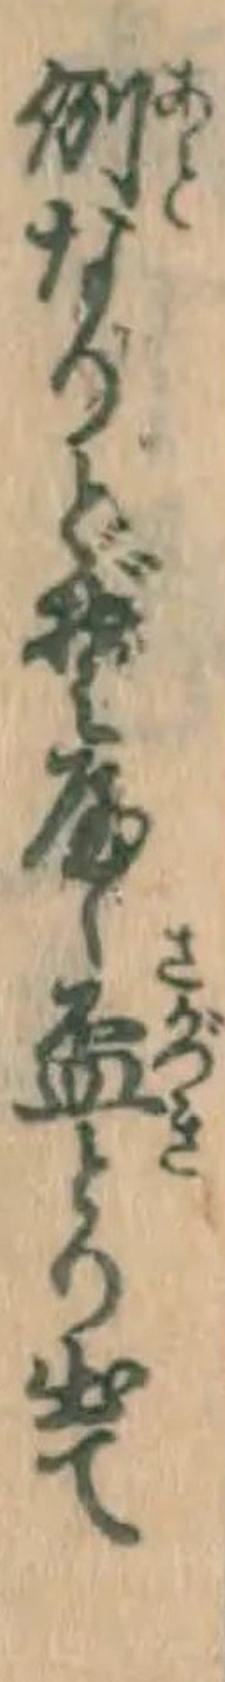例なりとぞやゝ盃とり出て
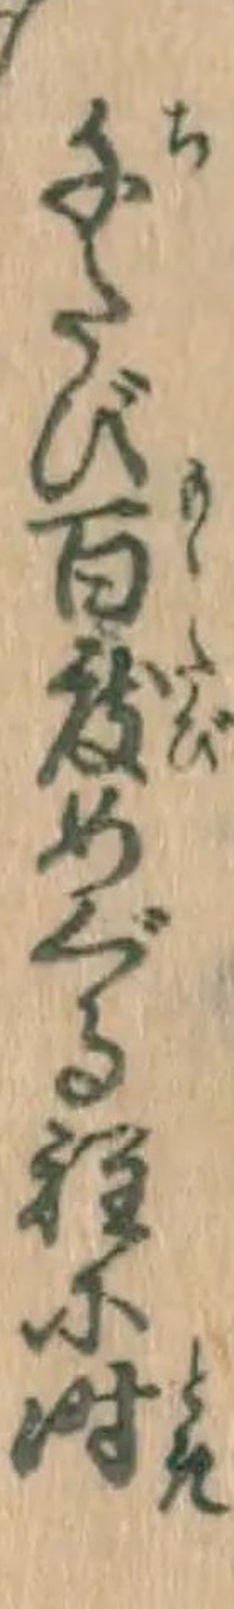千たび百度めぐる程に時
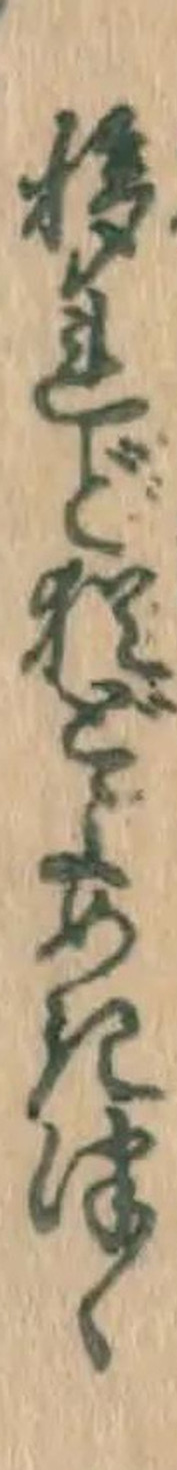移れど猶どよめきつゝ
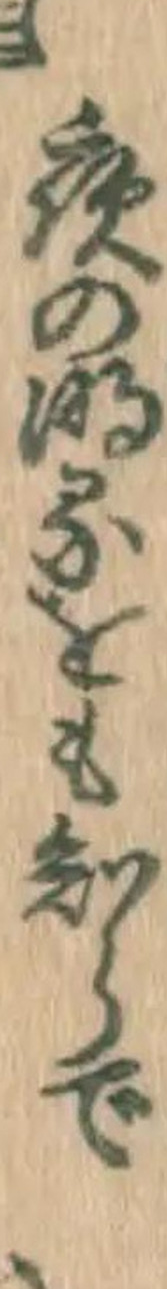夜の明るをも知らで
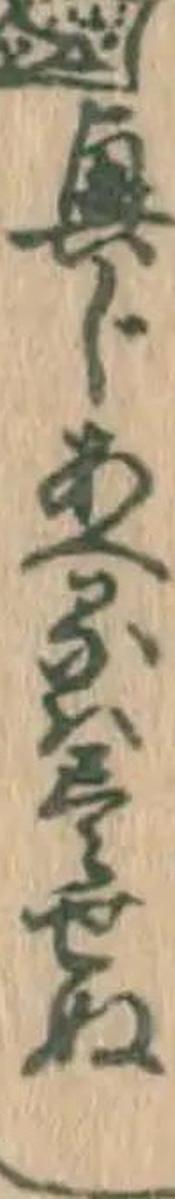興じあへるは尽せぬ
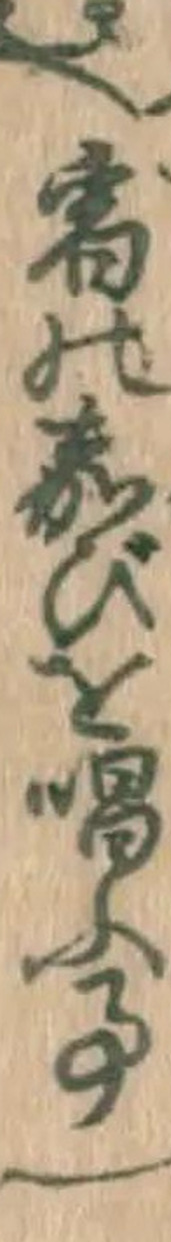宿の嘉びを唱ふ事
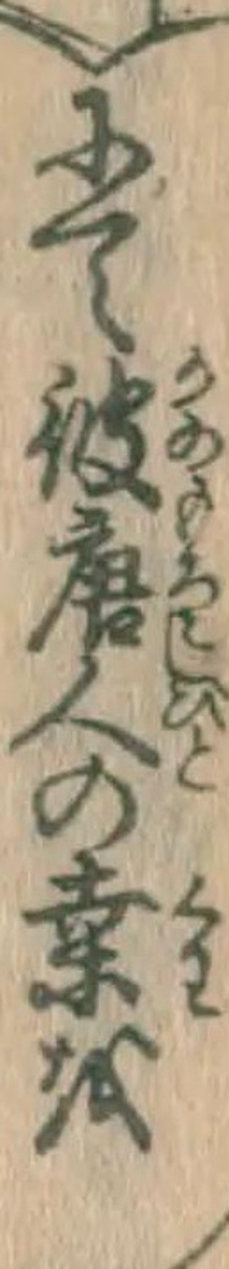にて彼唐人の桑を
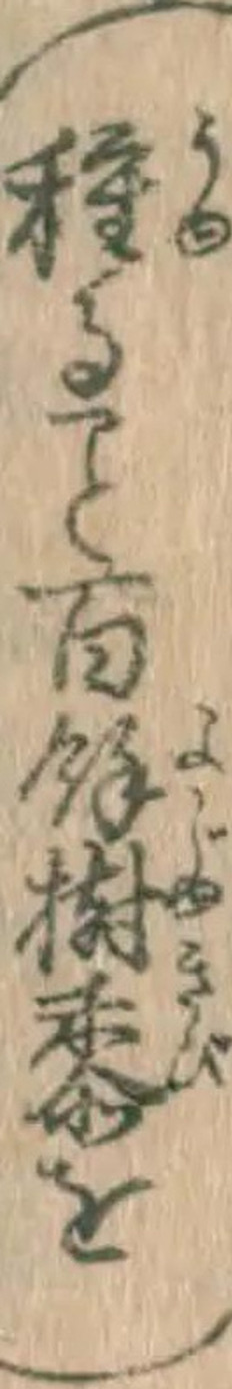種ること百余樹黍を
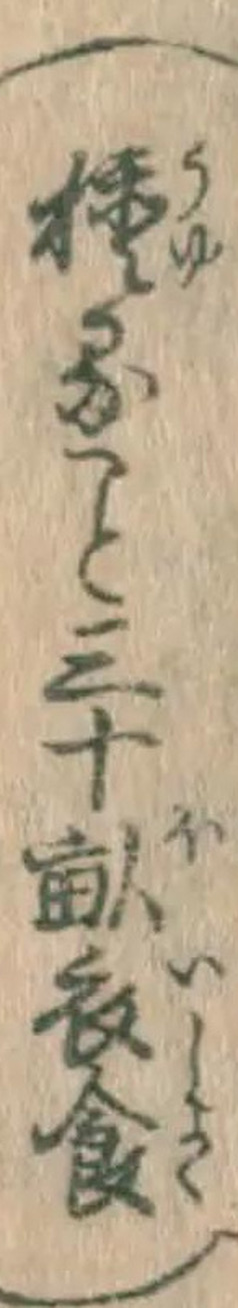種ること三十畝衣食
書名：養蚕秘録 3巻. [3]
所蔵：国立国会図書館 National Diet Library, JAPAN
